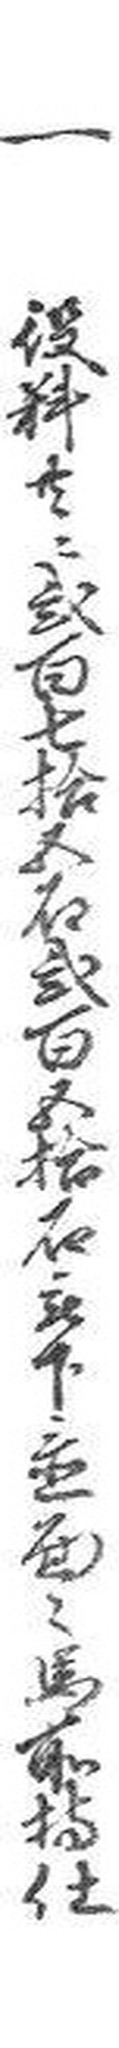一役料共ニ弐百七拾五石弐百五拾石被下置面々馬所持仕
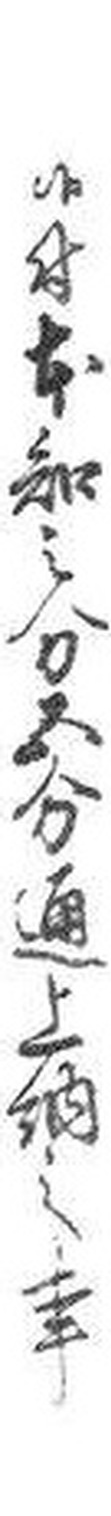候付本知之分五分通上納之事
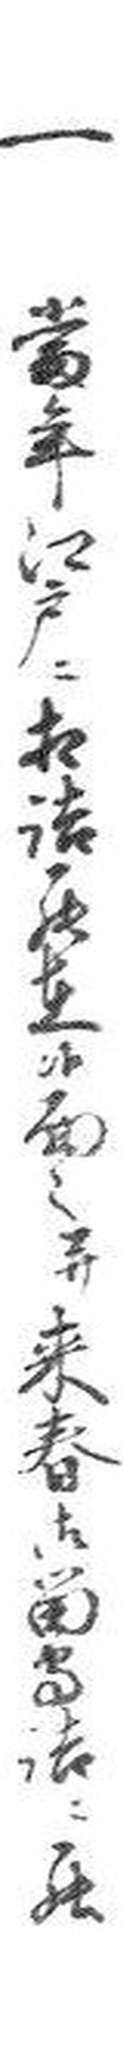一当年江戸ニ相詰罷在候面々并来春御留守詰ニ罷
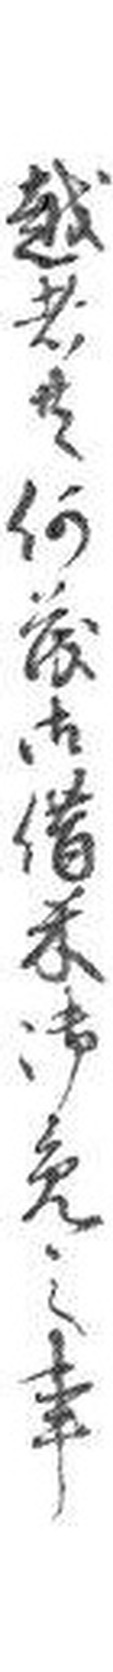越者共何茂御借米御免之事
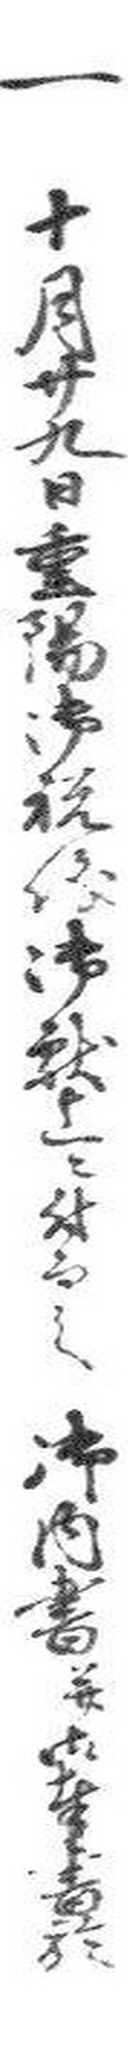一十月廿九日重陽御祝儀御献上ニ付而之御内書并御奉書於
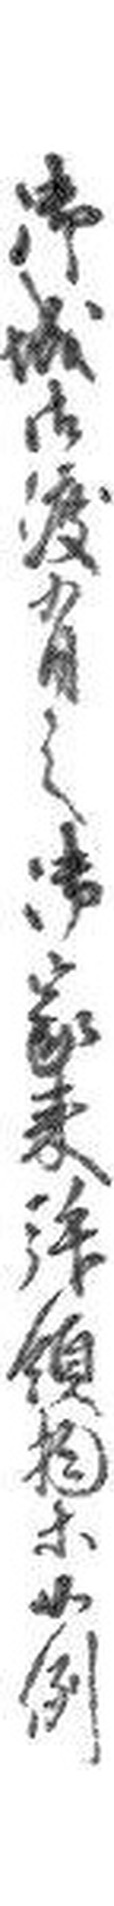御城御渡有之御家来拝領物等如例
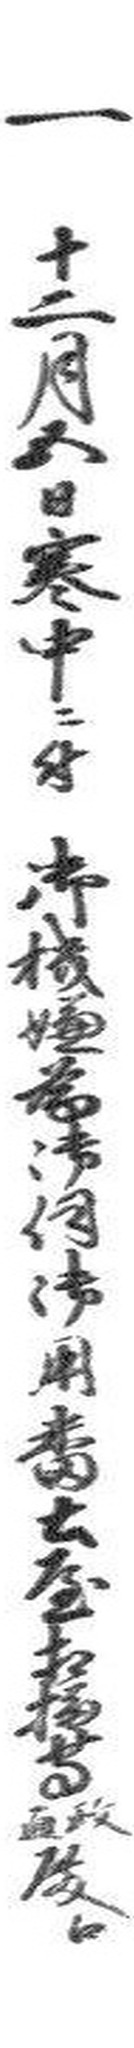一十二月五日寒中ニ付御機嫌為御伺御用番土屋相模守政直殿江
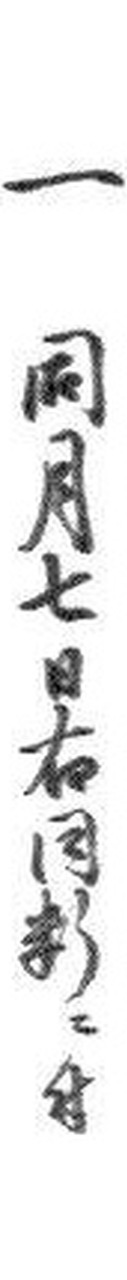一同月七日右同断ニ付
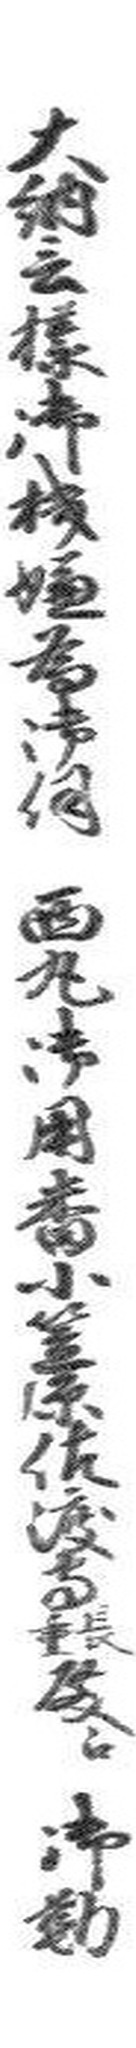大納言様御機嫌為御伺西丸御用番小笠原佐渡守長重殿江御勤
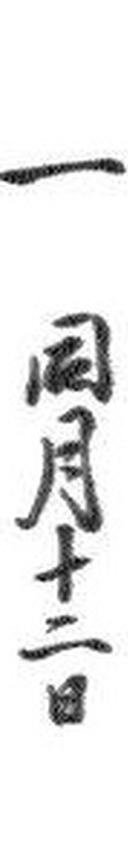一同月十二日
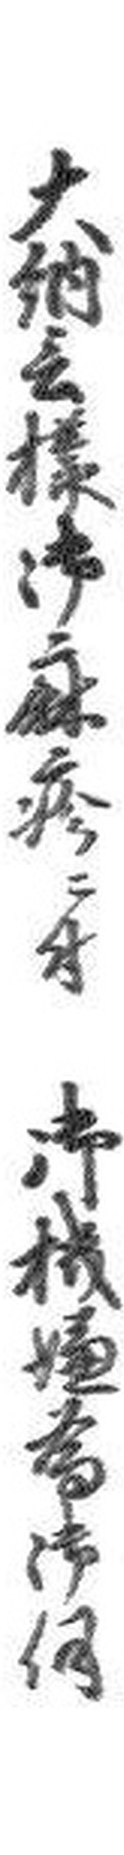大納言様御麻疹ニ付御機嫌為御伺
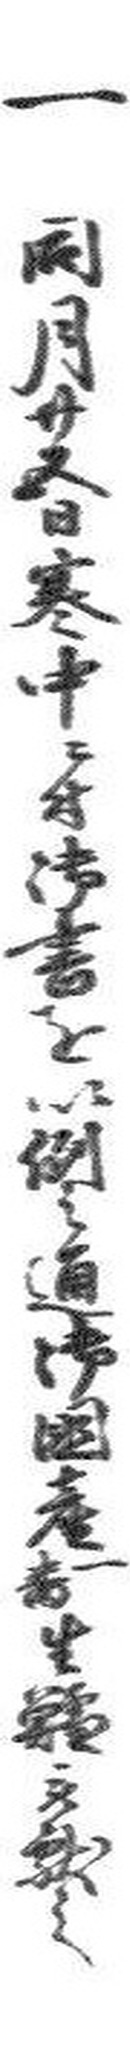一同月廿五日寒中ニ付御書を以例之通御国産一番生鱈被献之

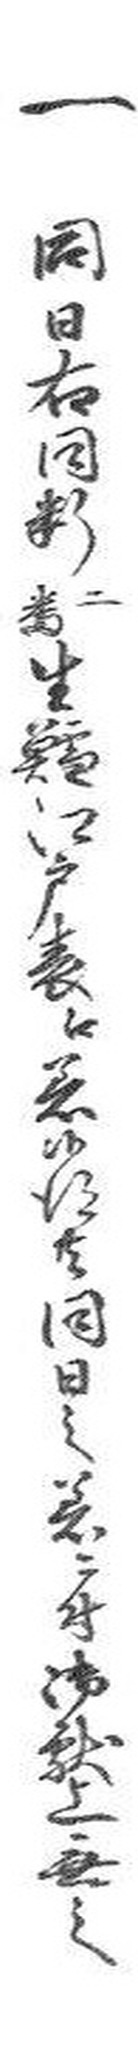一同日右同断二番生鱈江戸表江着候得共同日之着ニ付御献上無之
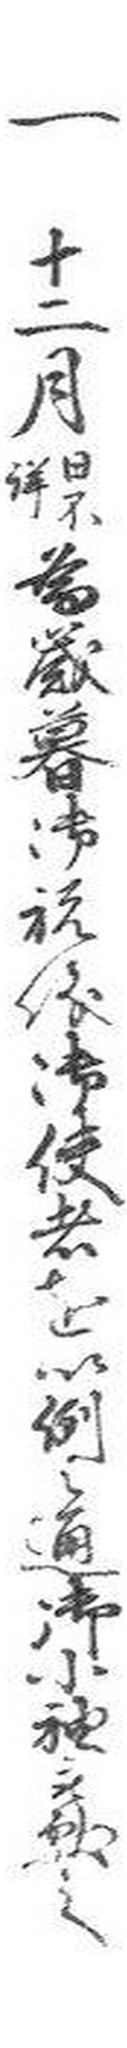一十二月日不詳為歳暮御祝儀御使者を以例之通御小袖被献之
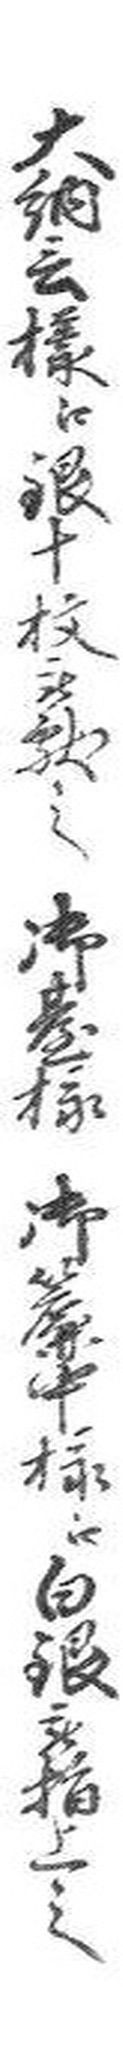大納言様江銀十枚被献之御台様御簾中様江白銀被指上之
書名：家譜 二十四 吉品公 従宝永三年到同五年
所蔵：福井県文書館 Fukui Prefectural Archives
